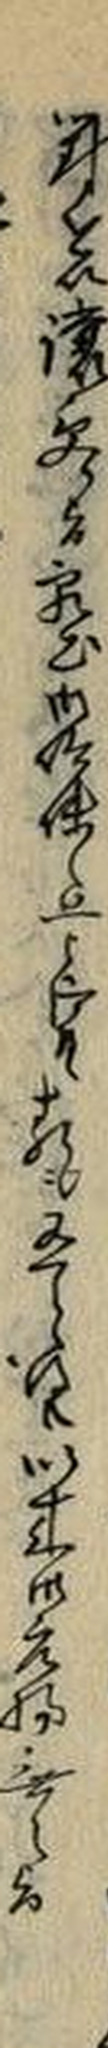対を以譲受候旨願出御吟味之上被仰付候類も有之候得共以来御取揚無之旨
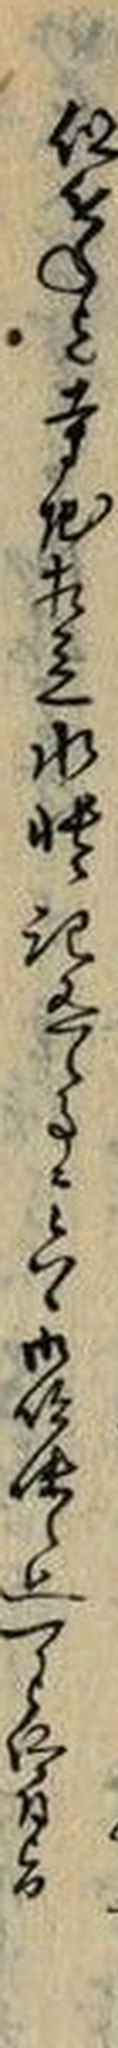但近年迄寺地相立水帳に記有之事に候はゝ御吟味之上可被仰付旨
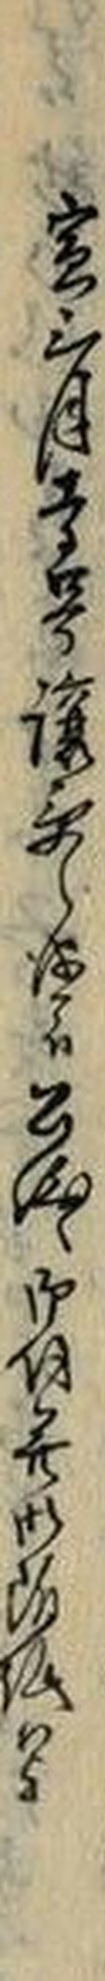一寅三月寺号譲受之儀に付公儀へ御伺并御附紙写
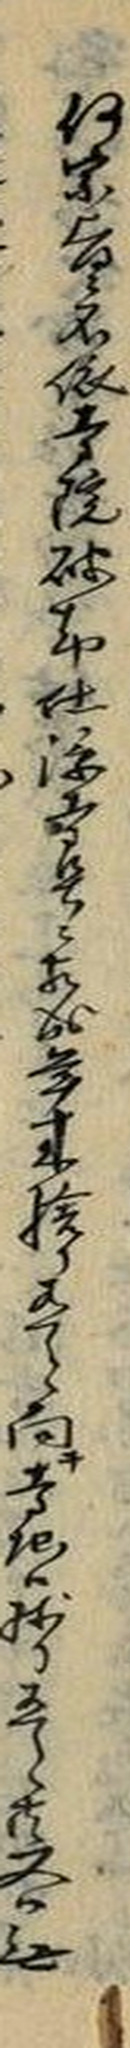何宗旨に不依寺院破却仕浮寺号に相成年来捨り有之候向キ寺地は残り有之候共又は無
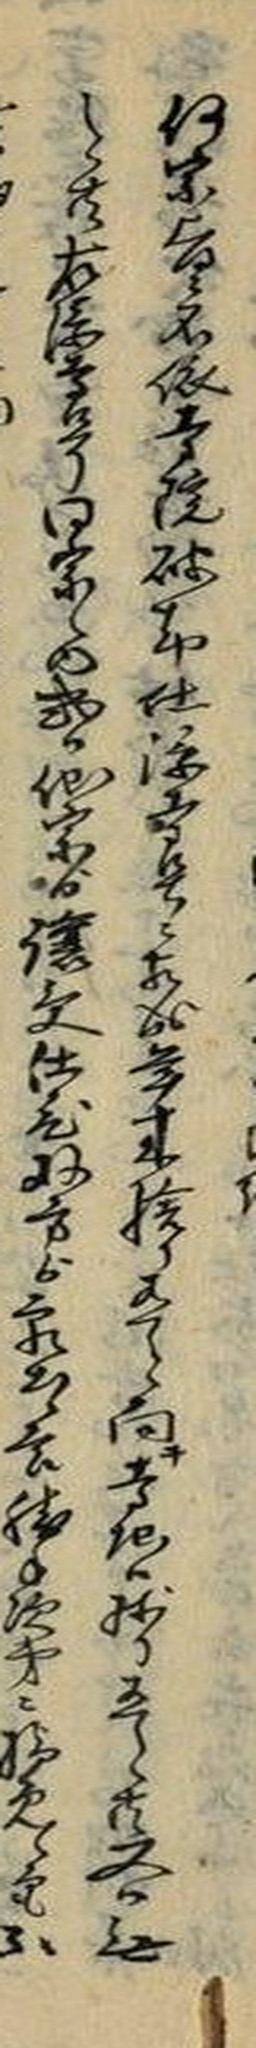之候共右浮寺号同宗之内或は他宗ゟ譲受仕度双方ゟ願出候節勝手次第に指免候ても不
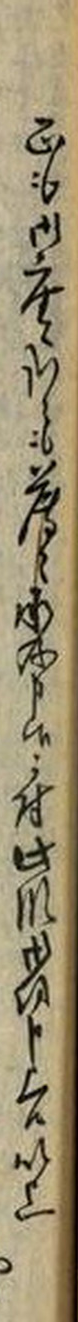正も御座候哉とも薄々承及申候に付此段御伺申上候以上
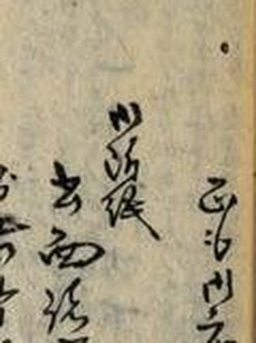御附紙
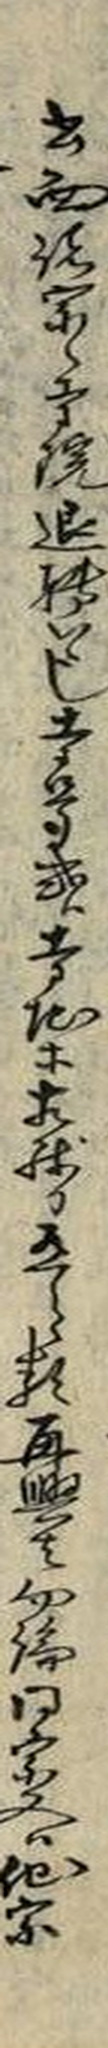書面諸宗之寺院退転いたし寺号或は寺地等相残り有之候類再興は勿論同宗又は他宗
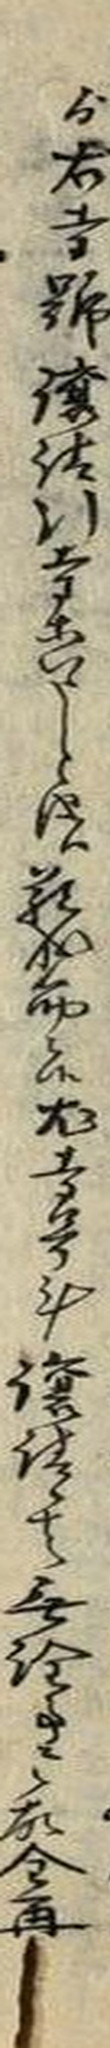ゟ右寺号譲請引寺等いたし候儀は難成筋に候尤寺号斗譲請候は無詮事に候故全再
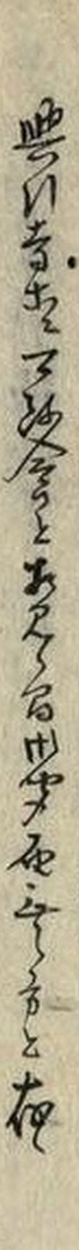興引寺等に可致含と相見候間御聞届無之方と存候
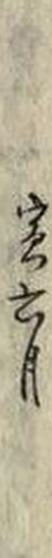寅六月
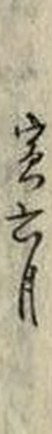寅六月
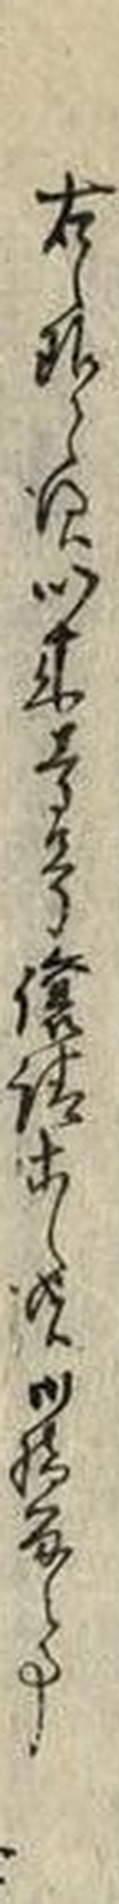右之趣に候得は以来寺号譲請等之儀は御指留之事
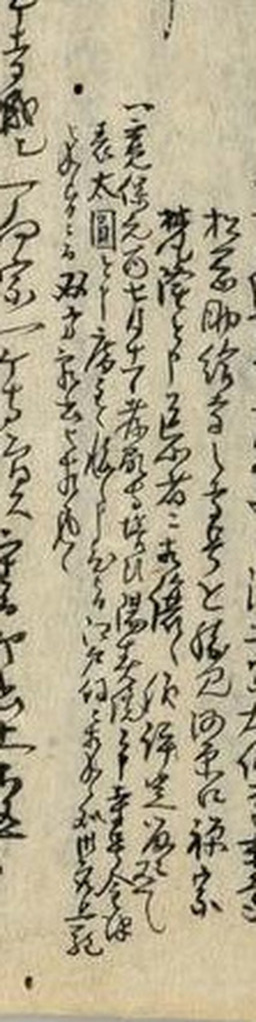一寛保元酉七月十一日孝顕寺塔頭陽春院と申寺号金沢
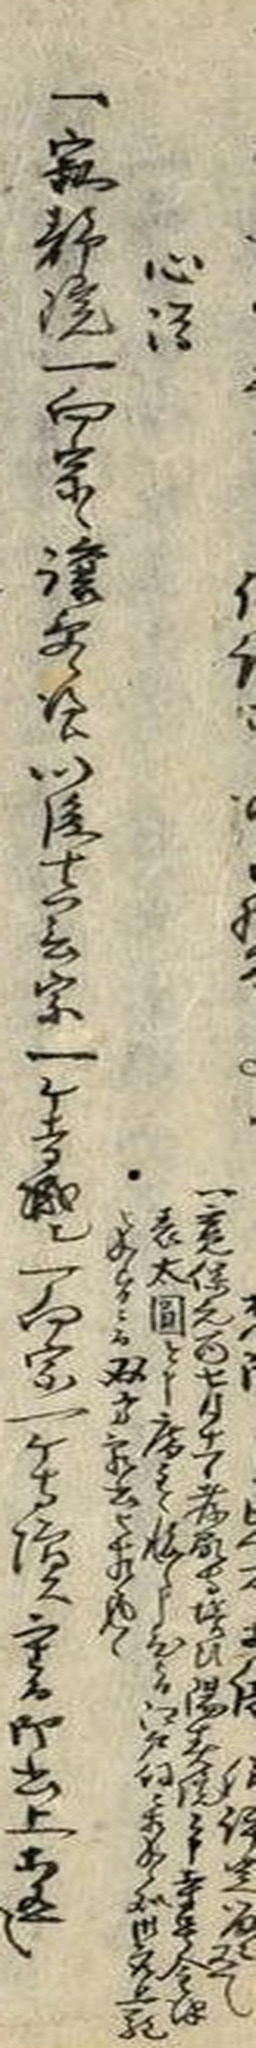一寂静院一向宗へ譲受候得は以後真言宗一ケ寺減シ一向宗一ケ寺増ス重て御書上等有之
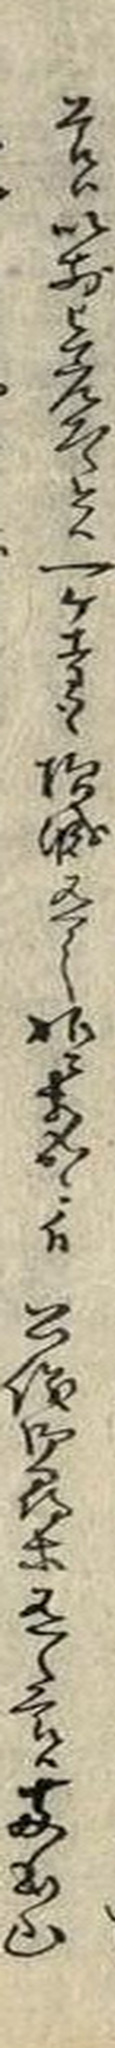節は以前被差出候とは一ケ寺ツヽ増減有之趣に相成候に付公儀御尋等有之節は両本山
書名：御城下諸事之部
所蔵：福井県文書館 Fukui Prefectural Archives
